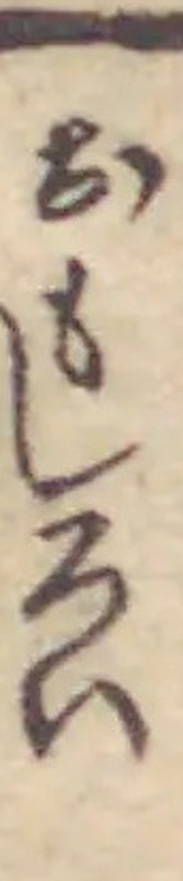おもしろい
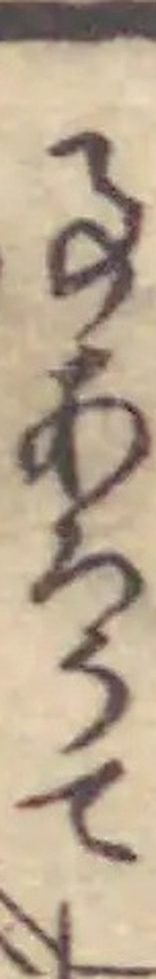事あらうて

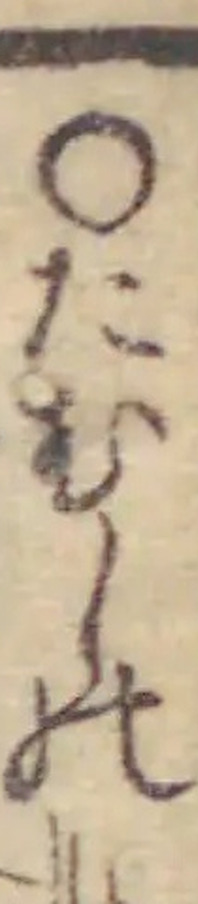○たむしの
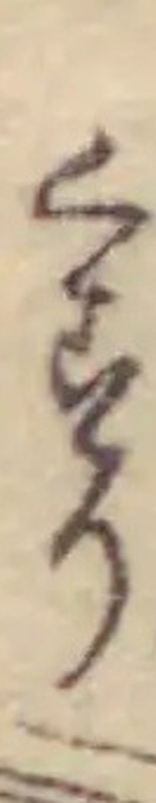くすり
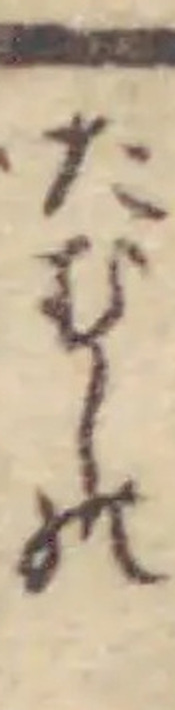たむしの
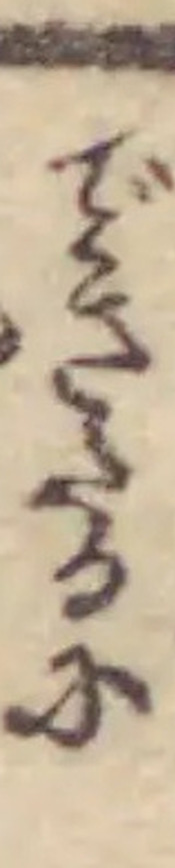できたるに
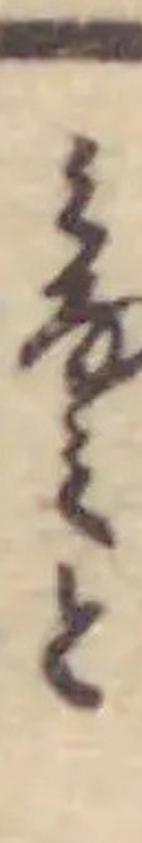みなみと
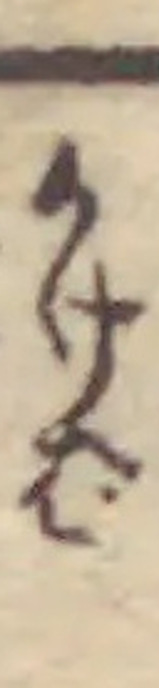かけば
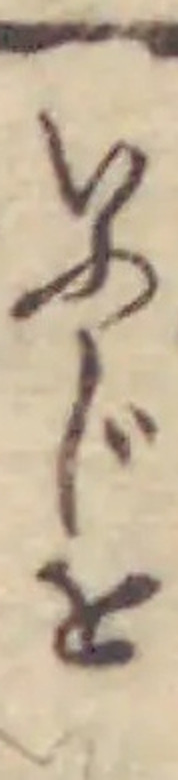いふじを
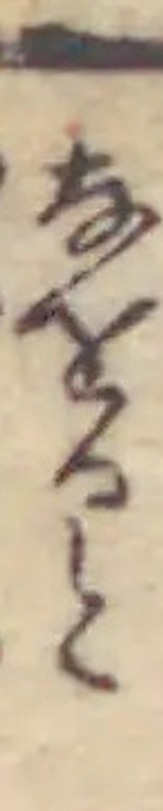なをると
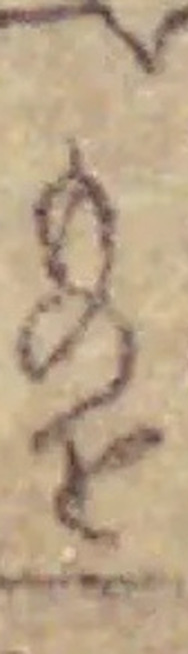ものを
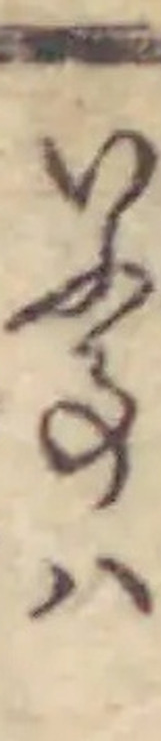いふ事は
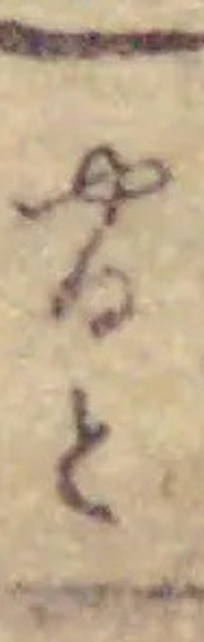やると
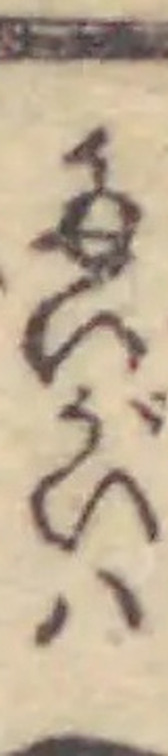たいがいは
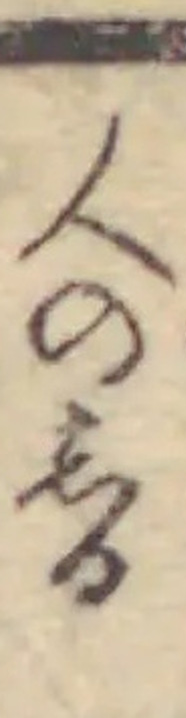人のしる
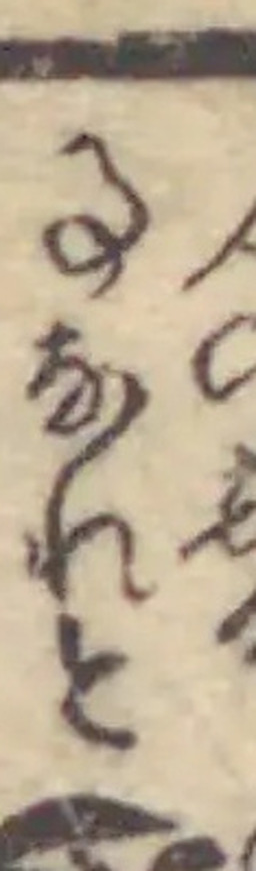事なれと
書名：家伝寿命薬 2巻
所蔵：国立国会図書館 National Diet Library, JAPAN
